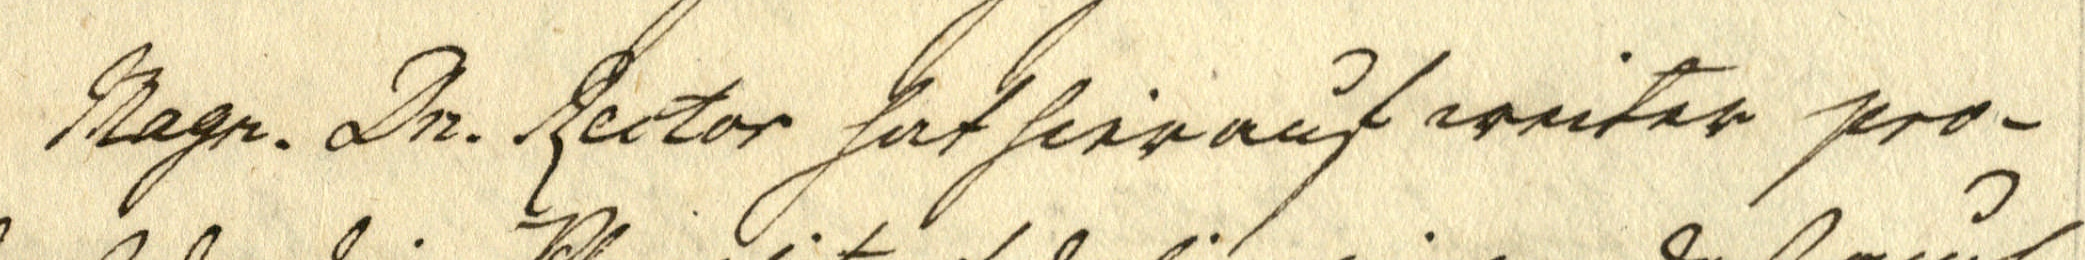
Magn. Dn. Rector hat hierauf weiter pro-
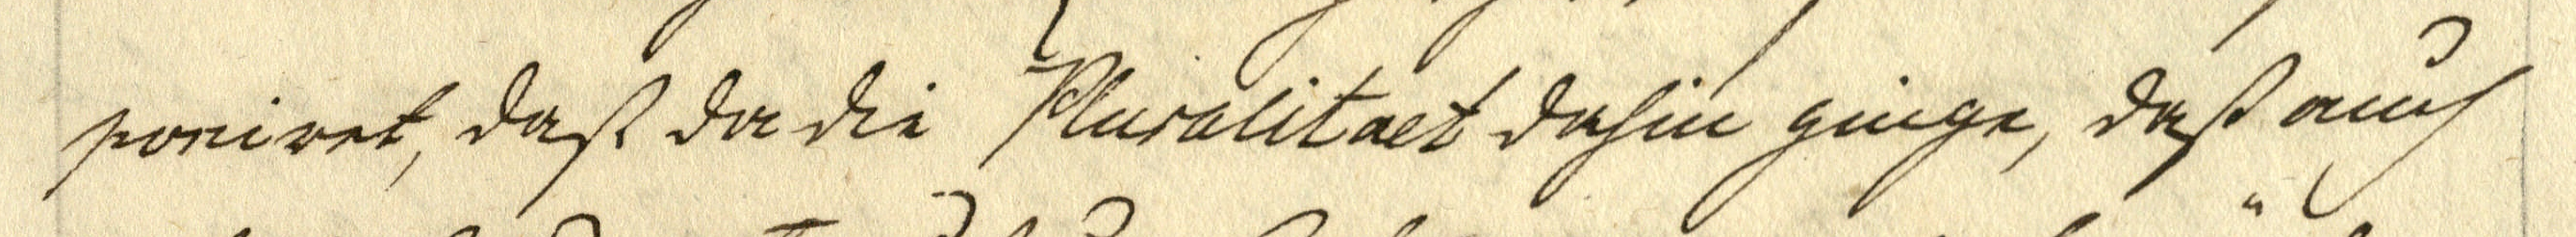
poniret, daß da die Pluralitaet dahin ginge, daß auch
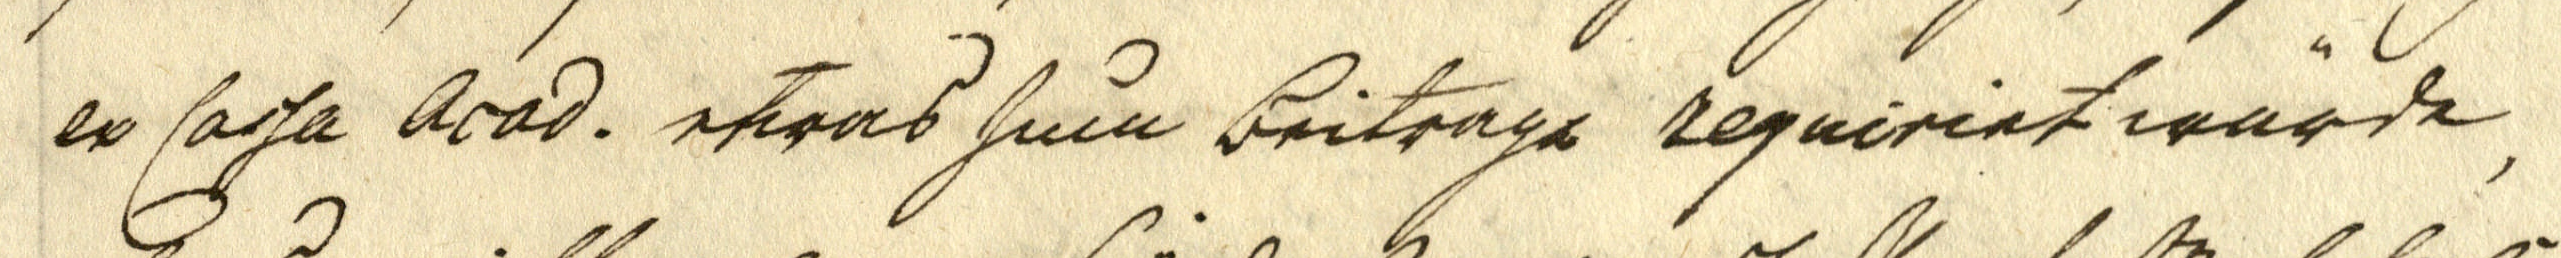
ex Cassa Acad. etwas zum Beitrage requirirt würde
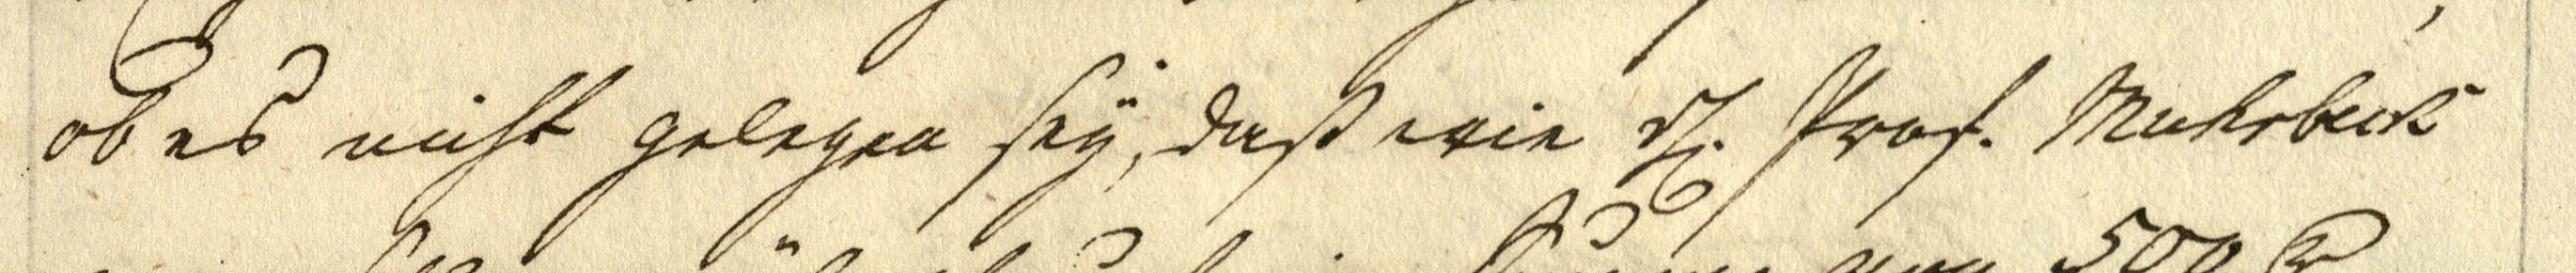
ob es nicht gelegen sey, daß wie dh. Prof. Muhrbeck
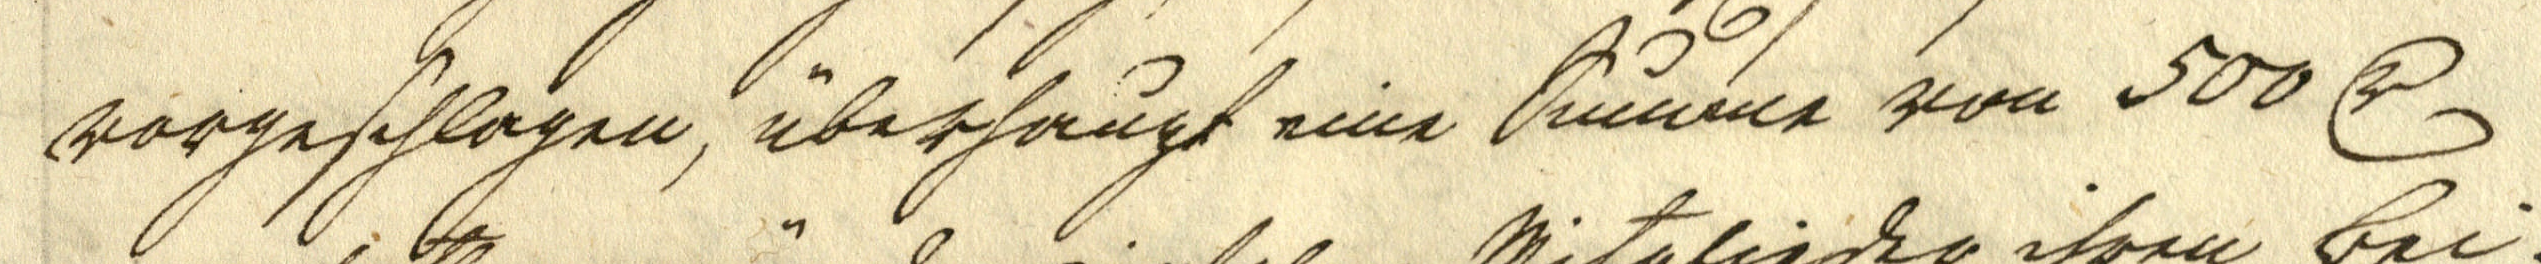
vorgeschlagen, überhaupt eine Summe von 500 rtl
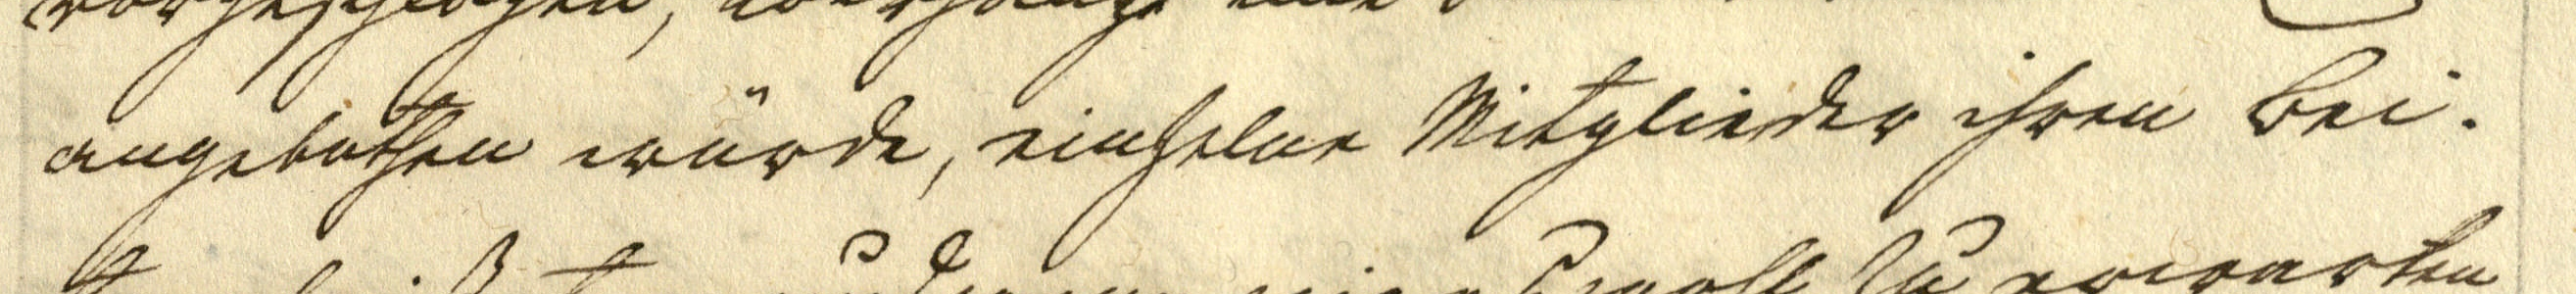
angebothen würde, einzelne Mitglieder ihren Bei-
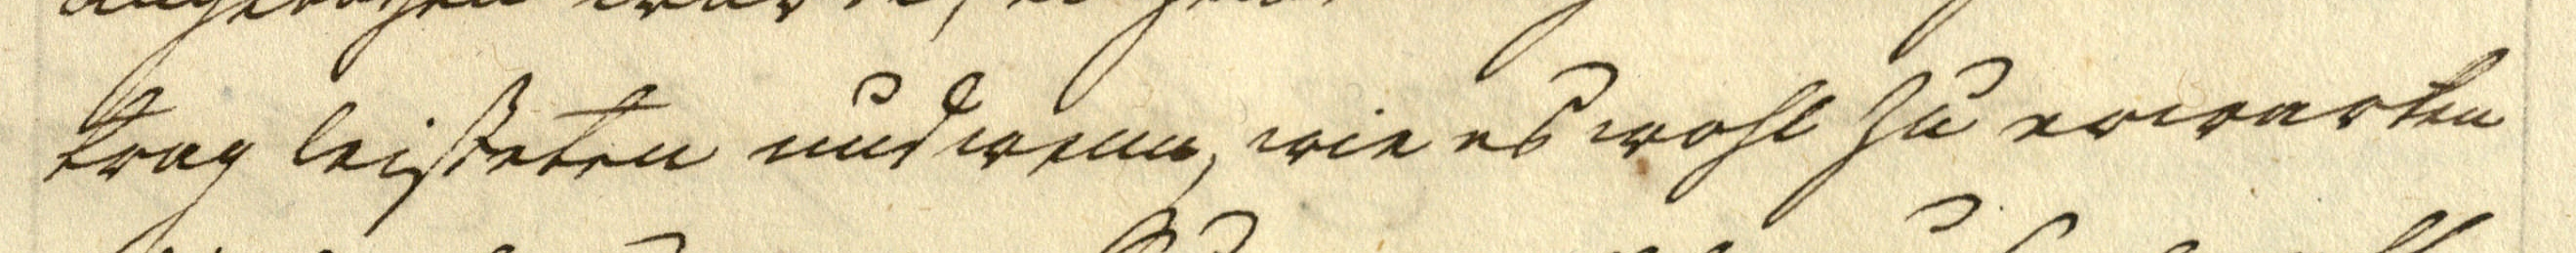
trag leisteten und wenn, wie es wohl zu erwarten
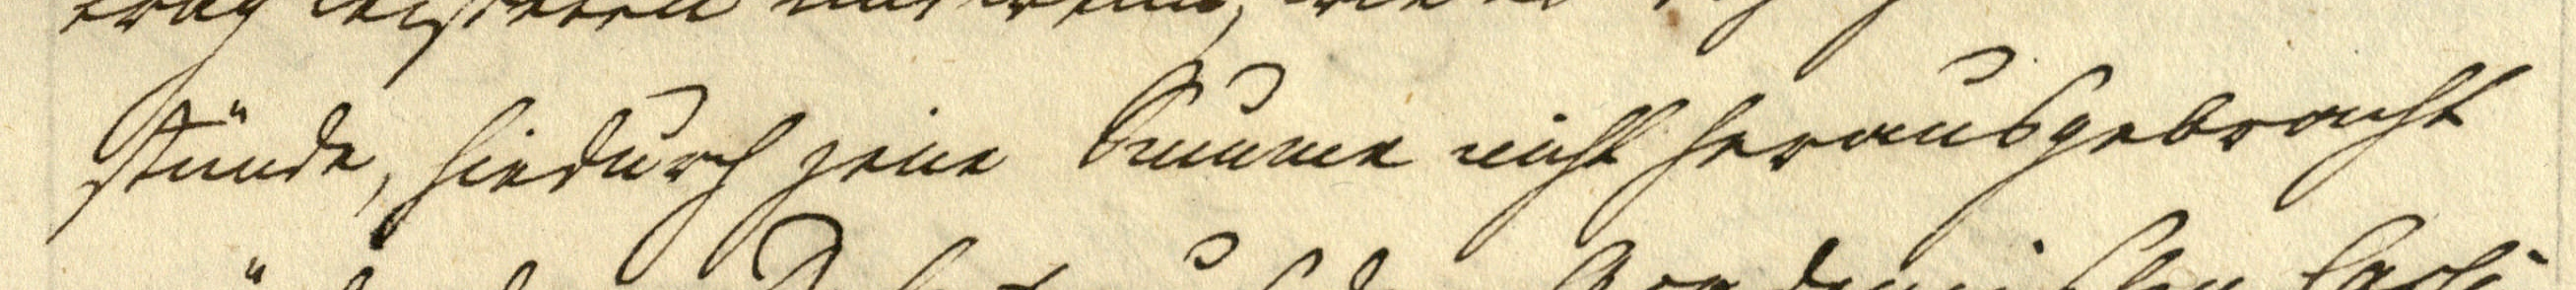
stünde, hiedurch jene Summe nicht herausgebracht
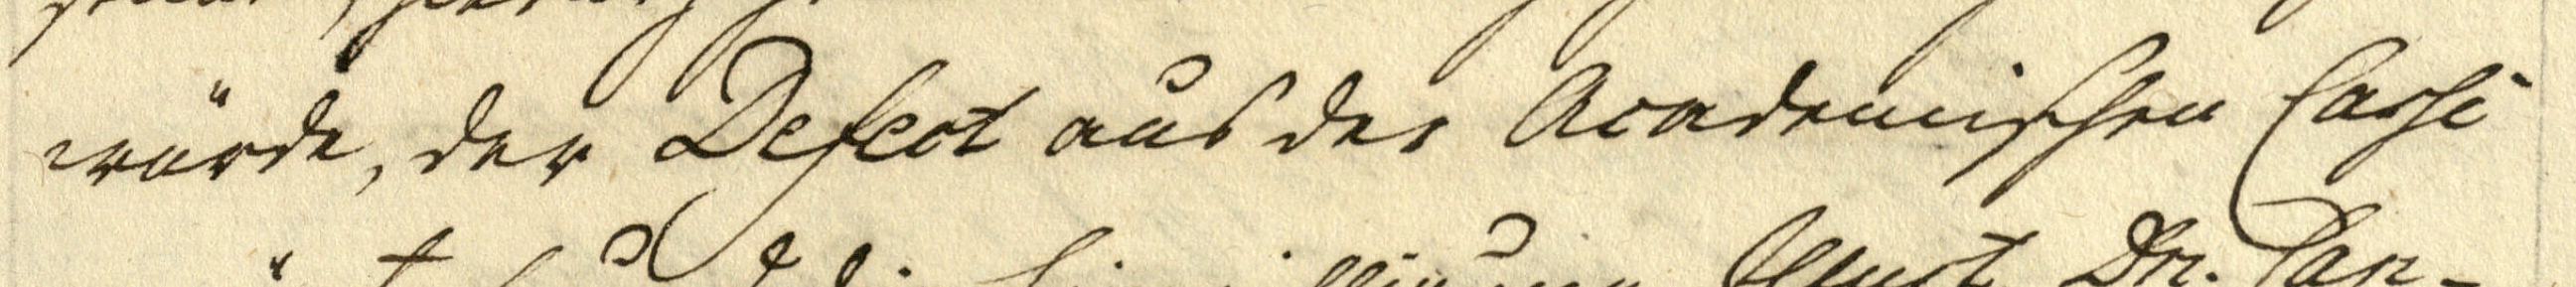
würde, der Defect aus der Academsichen Casse
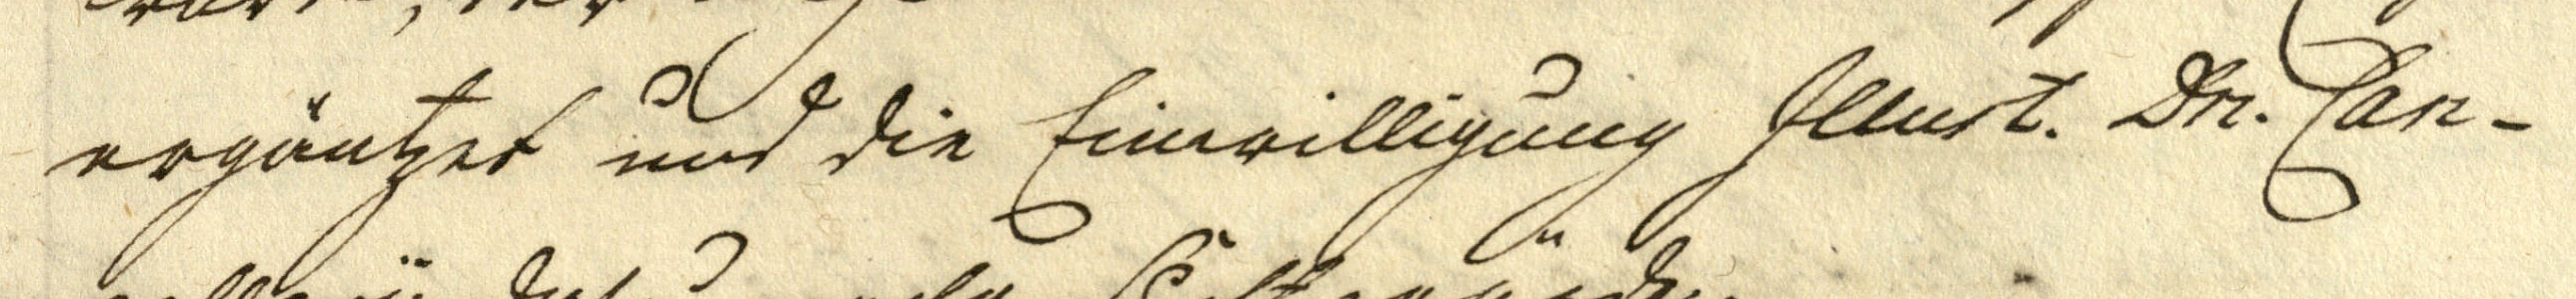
ergäntzet und die Einwilligung Illust. Dn. Can-
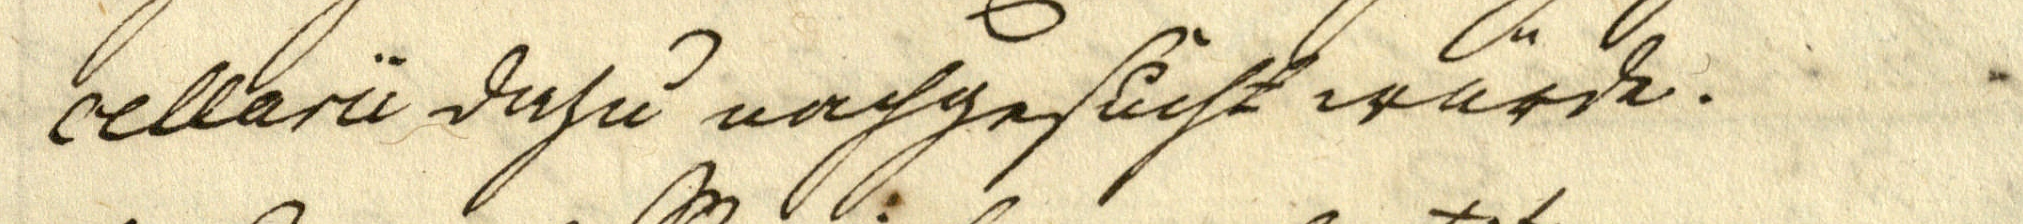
cellarii dazu nachgesucht würde.
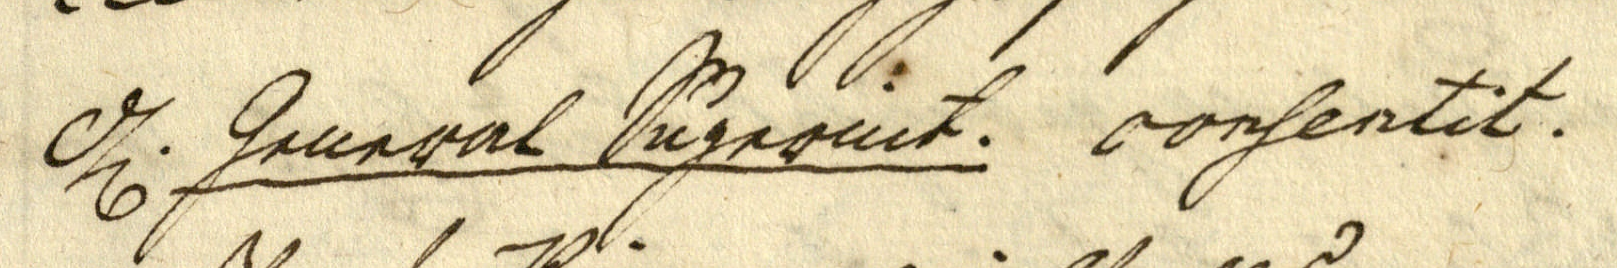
dh. General Superint. consentit.
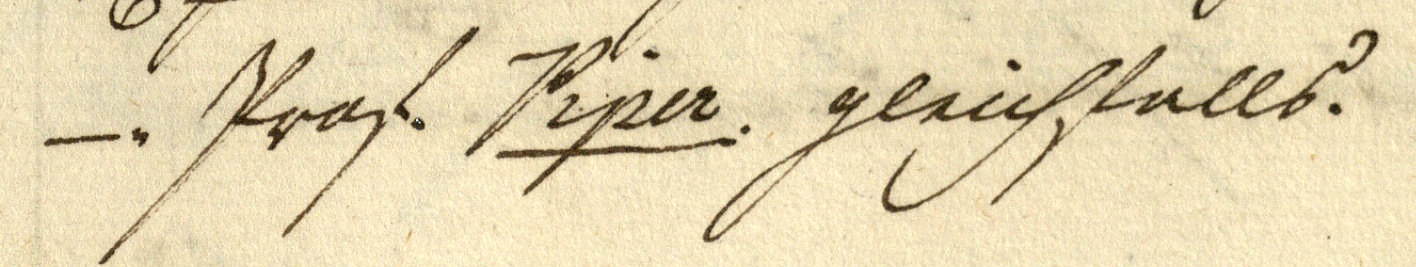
- " Prof. Piper. gleichfalls.
